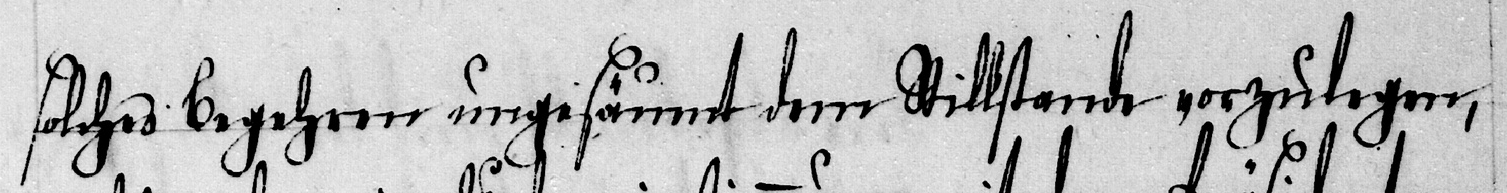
solches Begehren ungesäumt dem Stillstande vorzulegen,
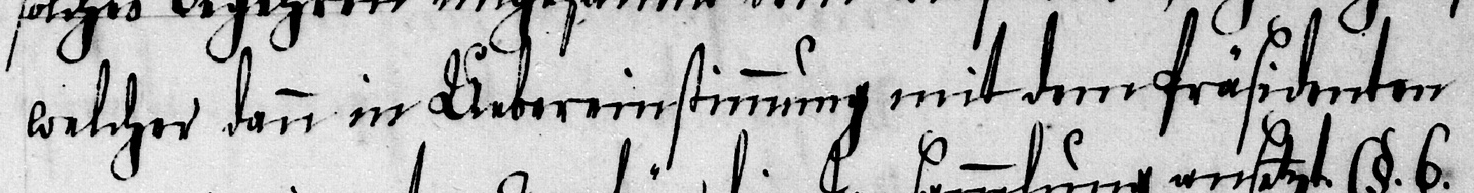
welcher dann in Uebereinstimmung mit dem Präsidenten
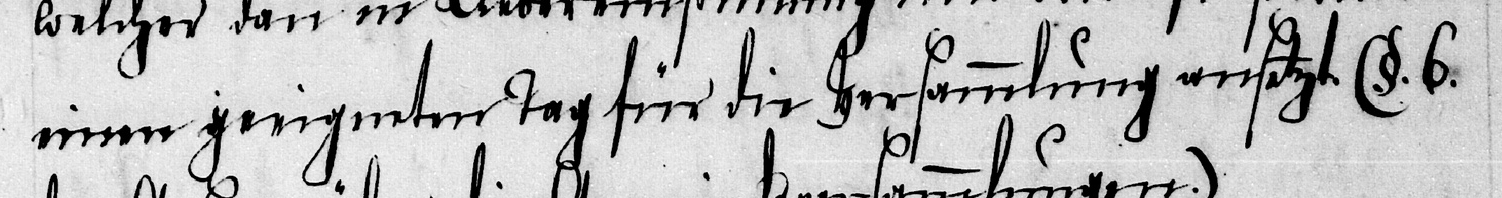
einen geeigneten Tag für die Versammlung ansetzt. (§. 6.
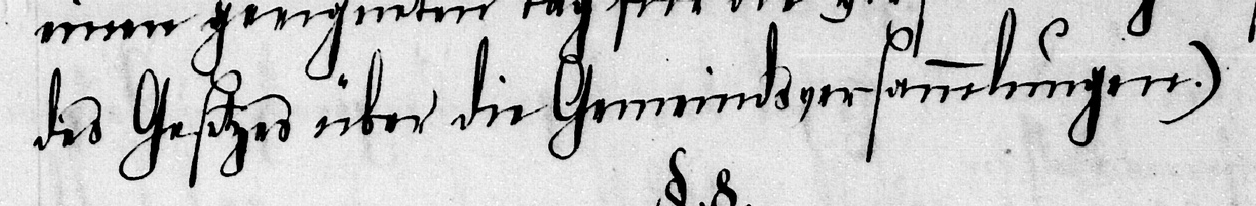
des Gesetzes über die Gemeindsversammlungen.)
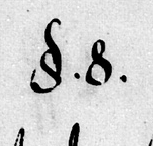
§. 8.
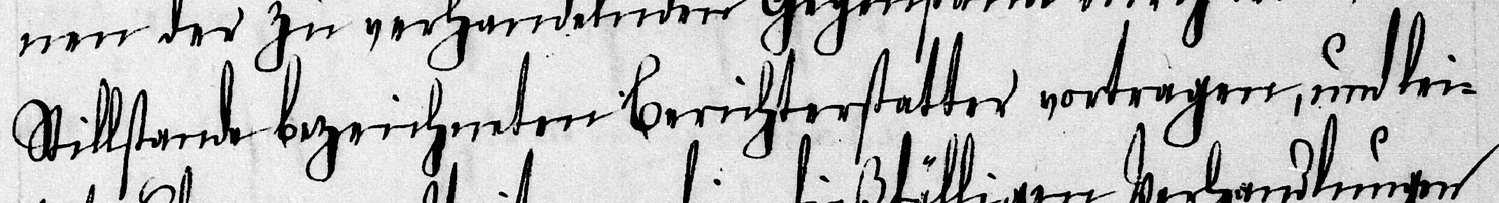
Stillstande bezeichneten Berichterstatter vortragen, und lei¬
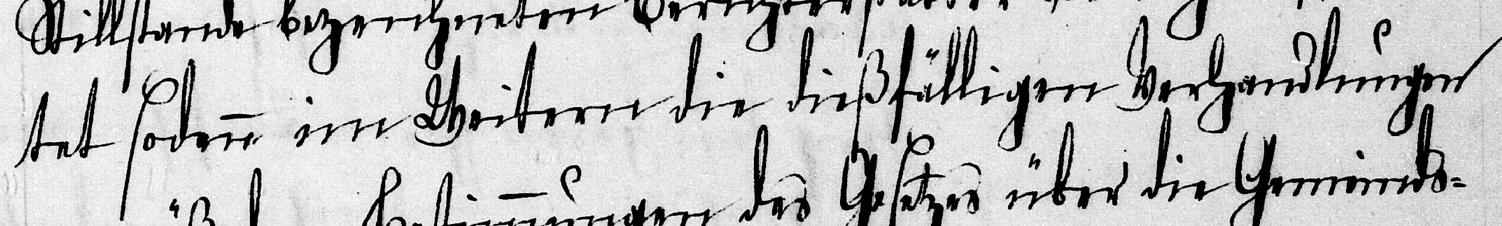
tet sodenn im Weitern die dießfälligen Verhandlungen
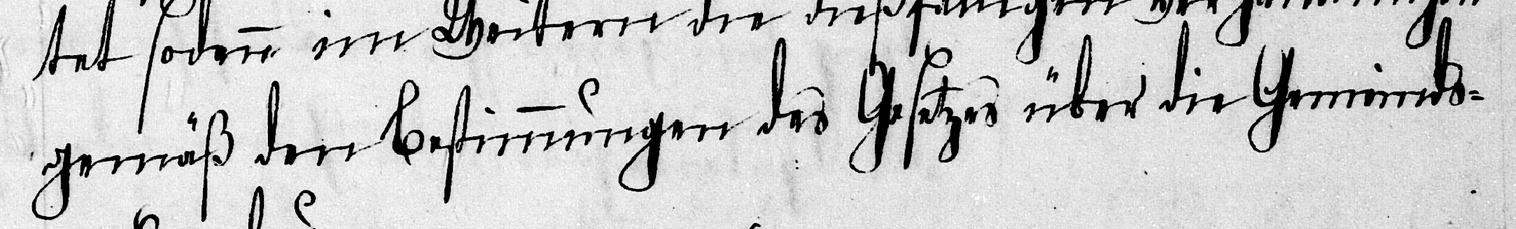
gemäß den Bestimmungen des Gesetzes über die Gemeinds¬
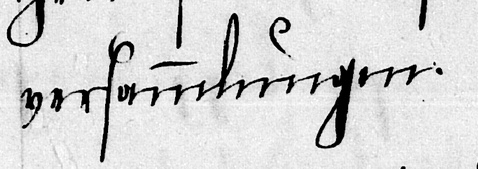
versammlungen.
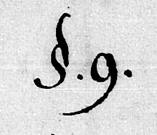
§. 9.
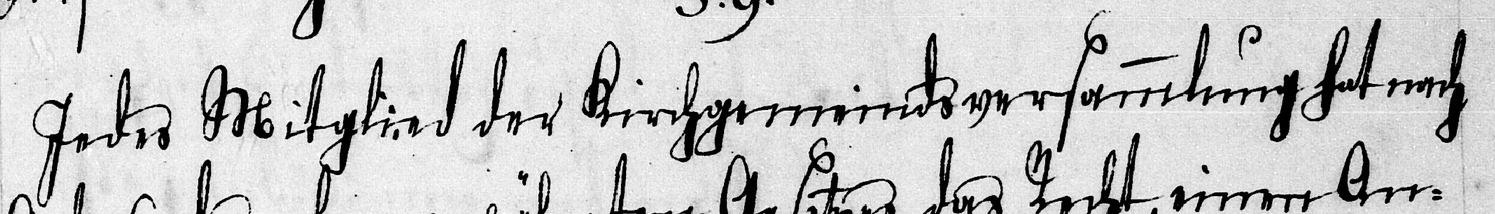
Jedes Mitglied der Kirchgemeindsversammlung hat nach
